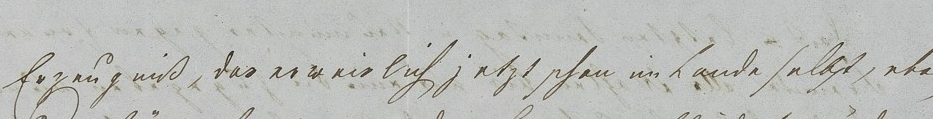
Erzeugniß, das erweislich jetzt schon im Lande selbst, eben
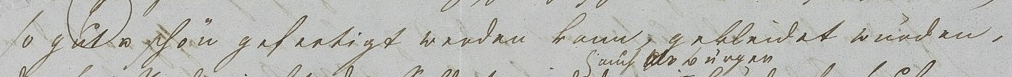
so gut & schön gefertigt werden kann, gekleidet würden,
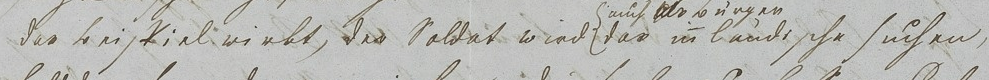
das Beispiel wirkt, der Soldat wird auch als Bürger das innländische suchen,
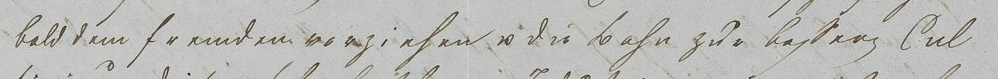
bald dem fremden vorziehen & die Bahn zur bessern Cul-
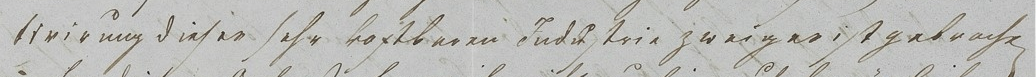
tivirung dieses sehr kostbaren Industriezweiges ist gebrochen.
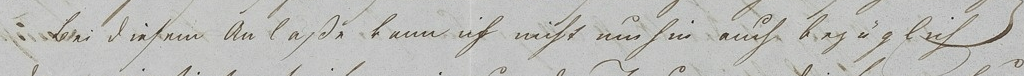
Bei diesem Anlaße kann ich nicht umhin auch bezüglich
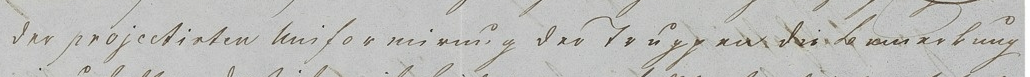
der projectirten Uniformirung der Truppen die Bemerkung
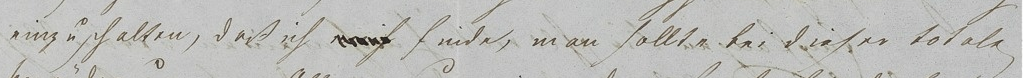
einzuschalten, daß ich mich finde, man sollte bei dieser totalen
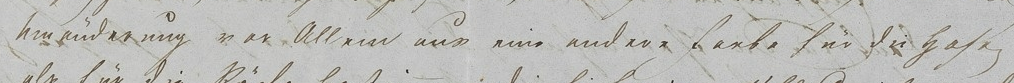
Umänderung vor Allem aus eine andere Farbe für die Hosen
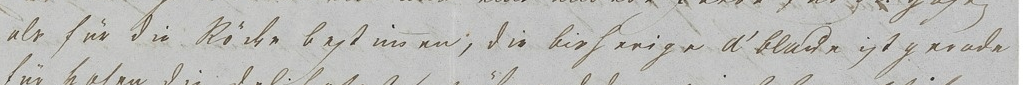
als für die Röcke bestimmen; die bisherige d'blaue ist gerade
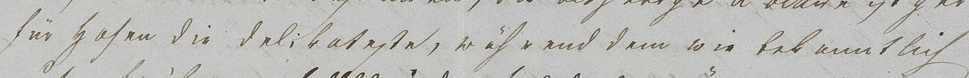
für Hosen die delikateste, während dem wie bekanntlich
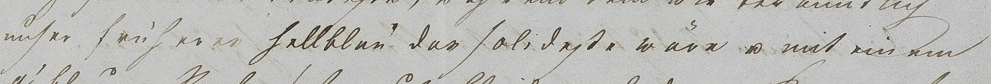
unser früheres Hellblau der solideste wäre & mit einem
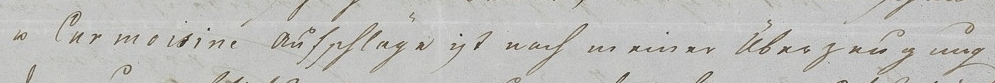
& Curmoisine Aufschläge ist nach meiner Überzeugung
